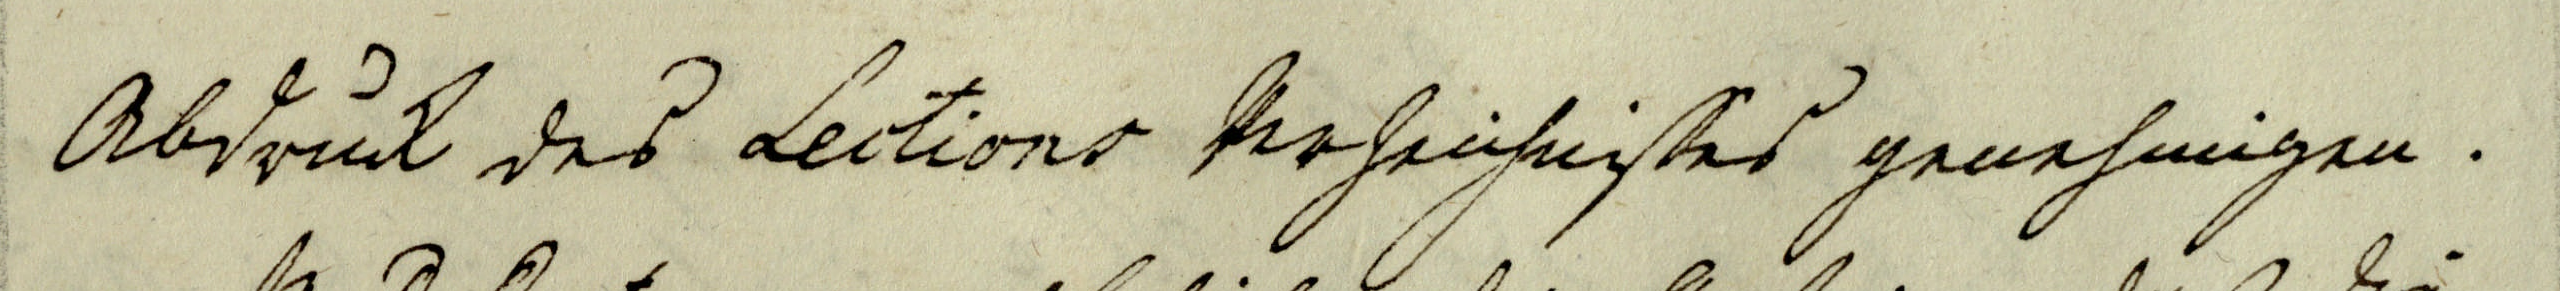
Abdruck des Lections Verzeichnisses genehmigen.
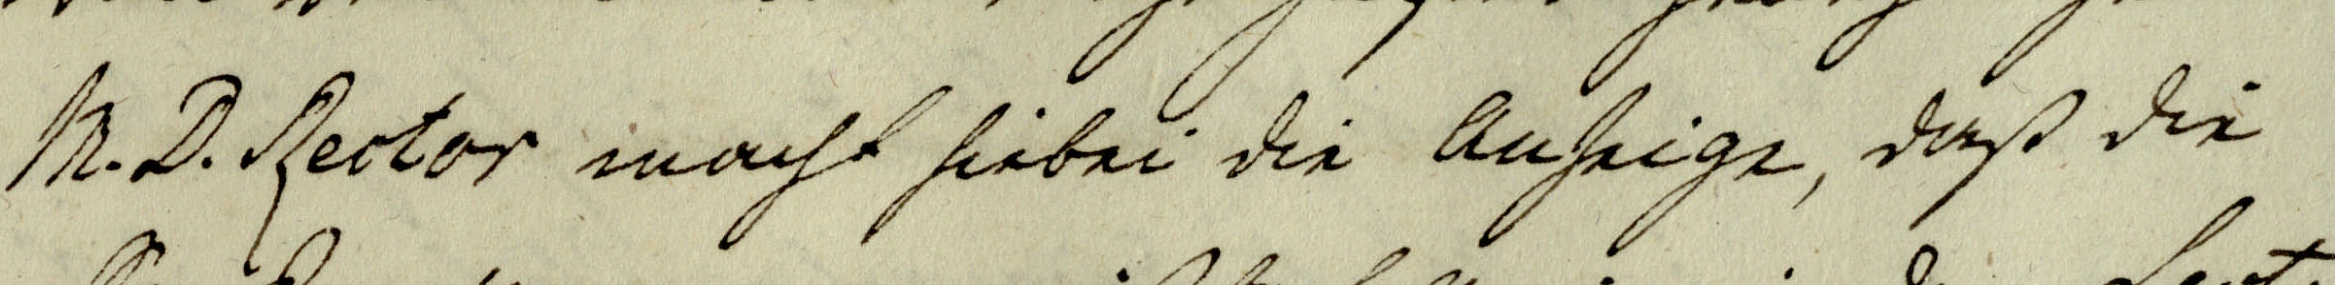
M. D. Rector macht hiebei die Anzeige, daß die
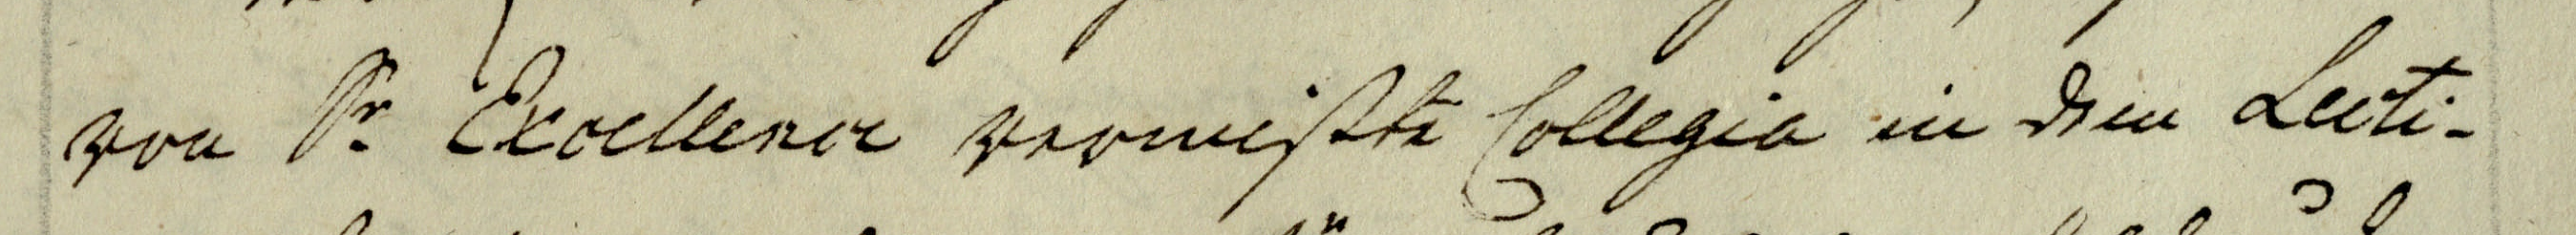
von Sr Excellence vermißte Collegia in dem Lecti¬
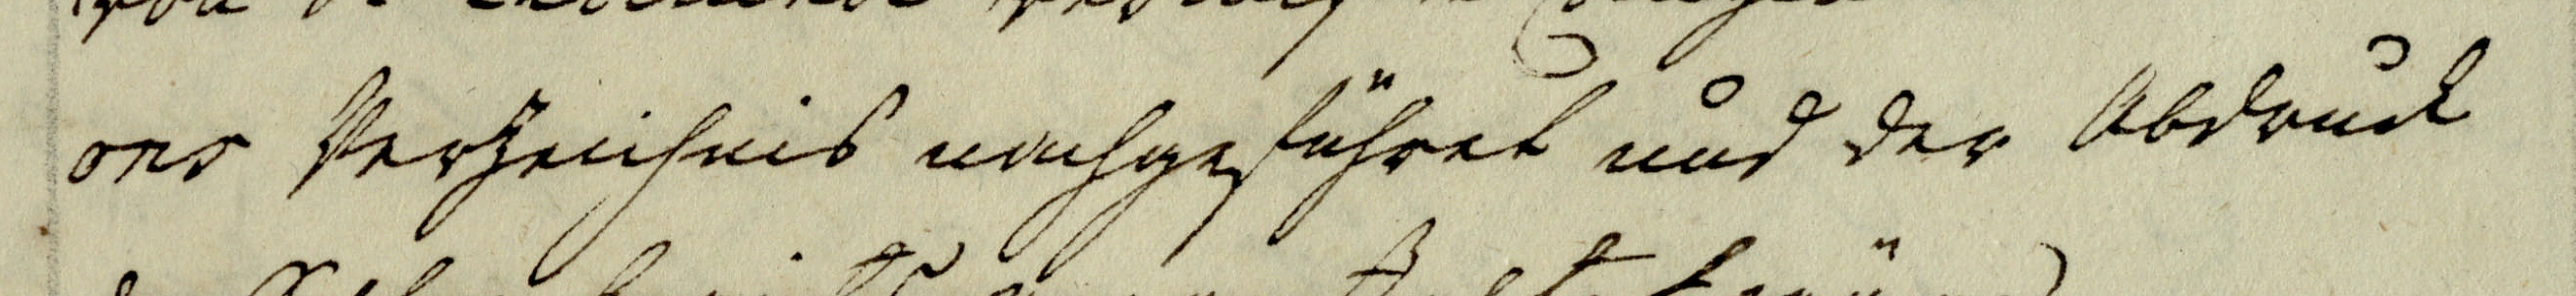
ons Verzeichnis nachgeführet und der Abdruck
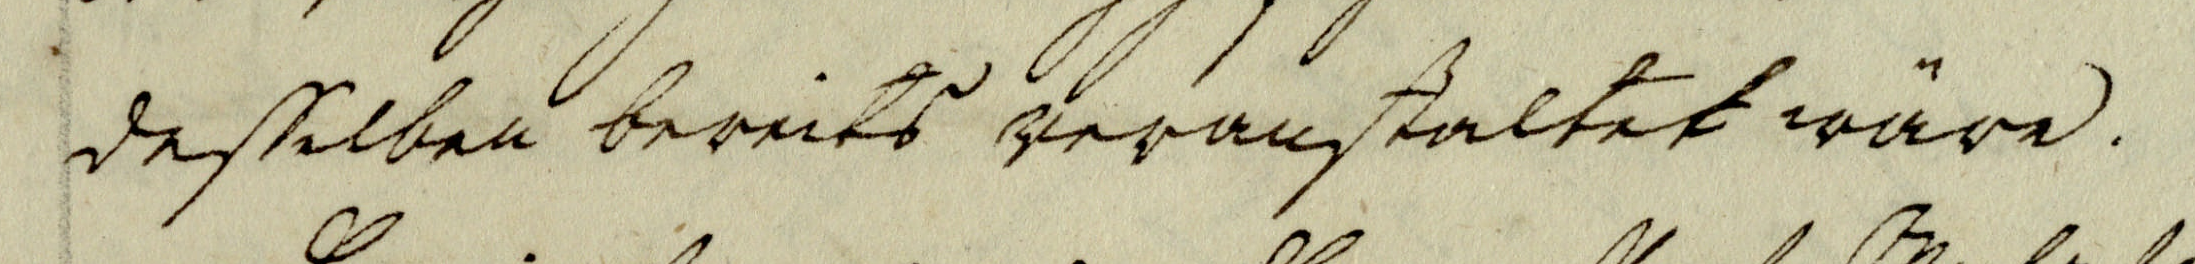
desselben bereits veranstaltet wäre.
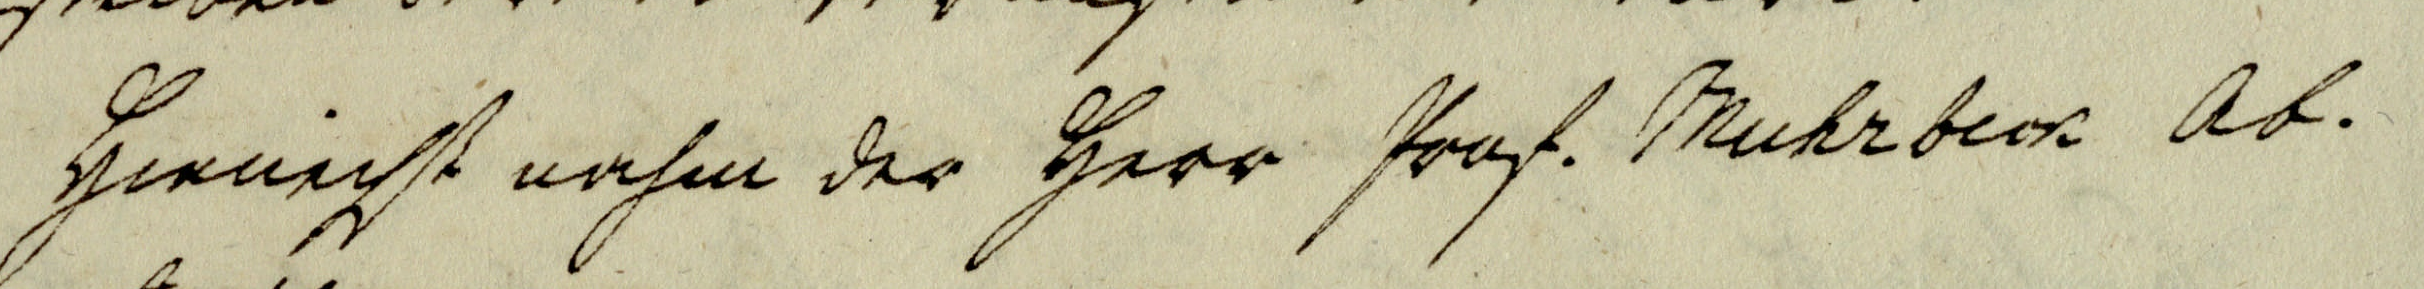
Hienechst nahm der Herr Prof. Muhrbeck Ab¬
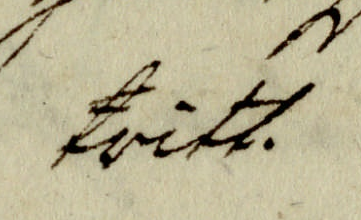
tritt.
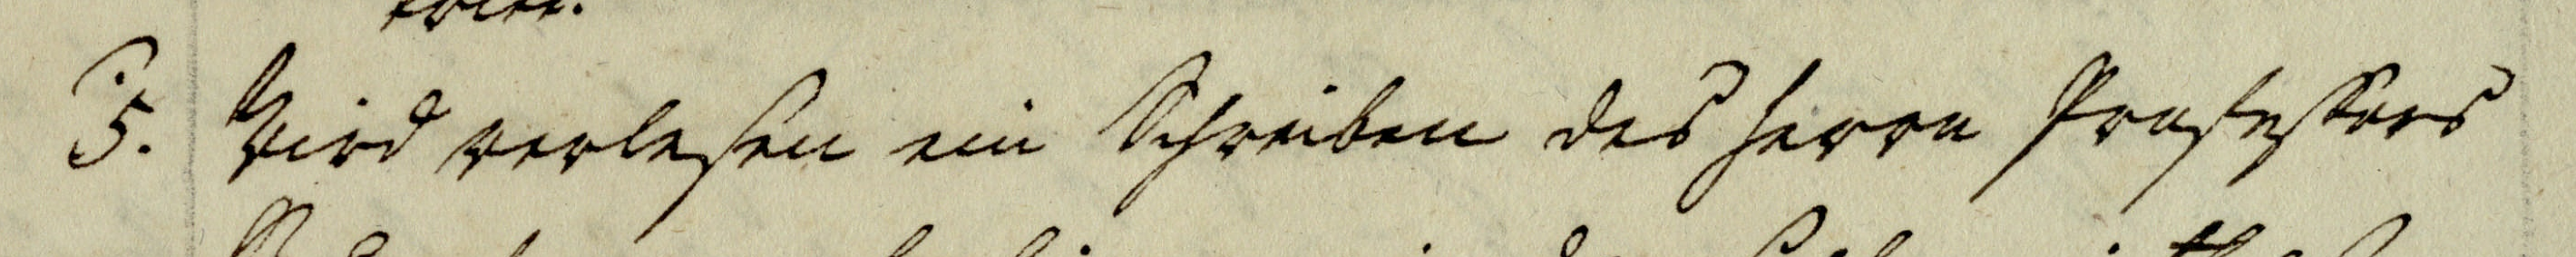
3. Wird verlesen ein Schreiben des Herrn Professors
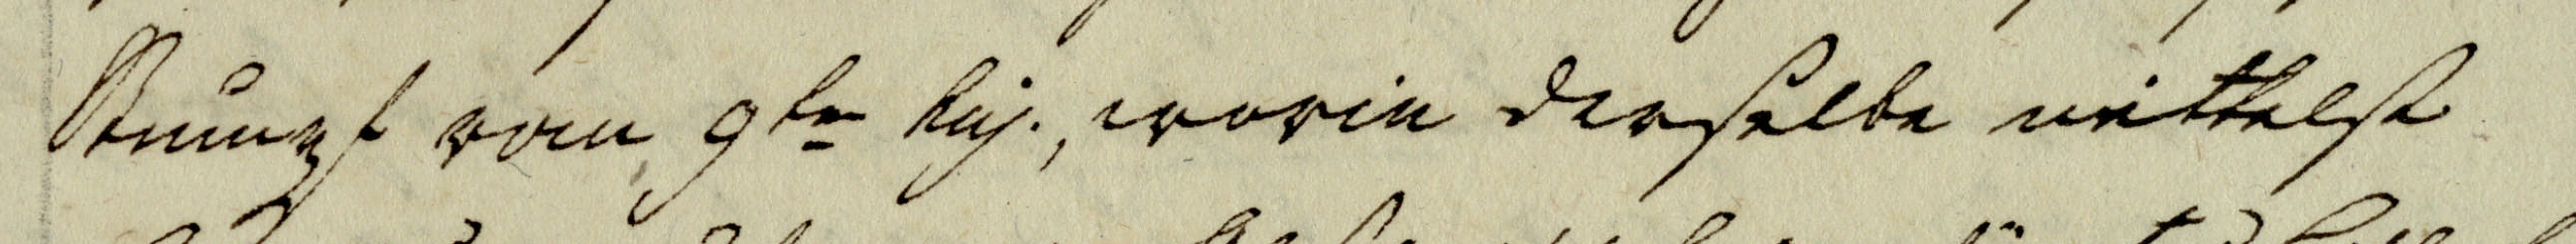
Stumpf vom 9 ten huj., worin derselbe mittelst
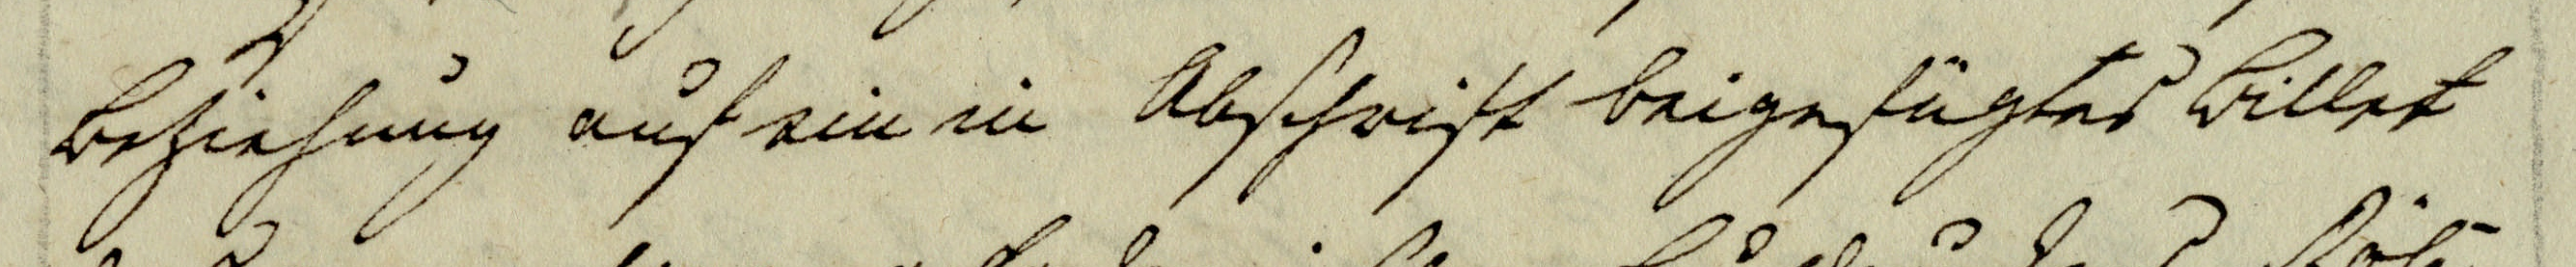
Beziehung auf ein in Abschrift beigefügtes Billet
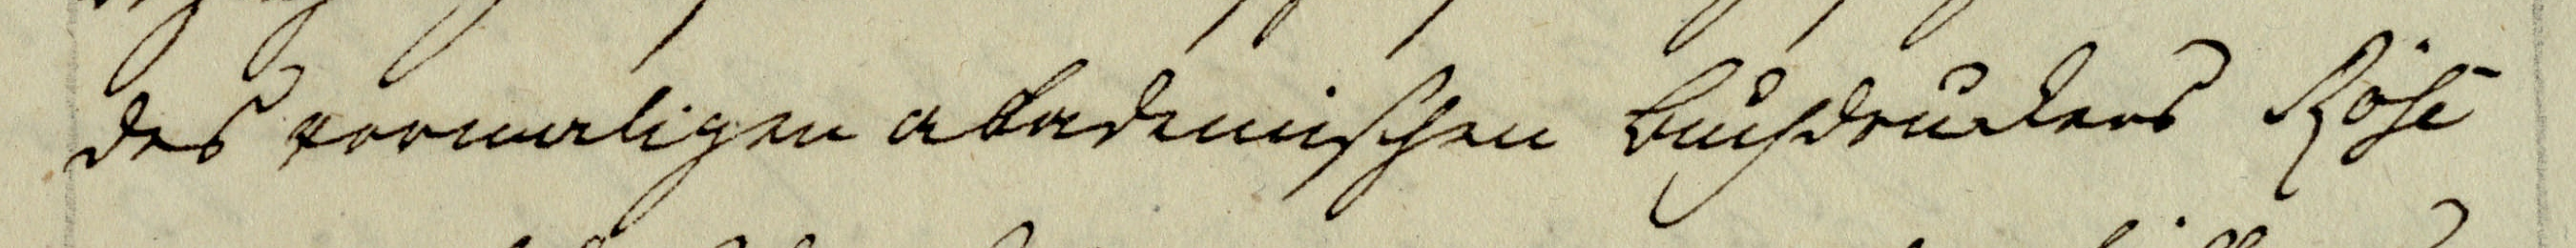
des vormaligen akademischen Buchdruckers Röse
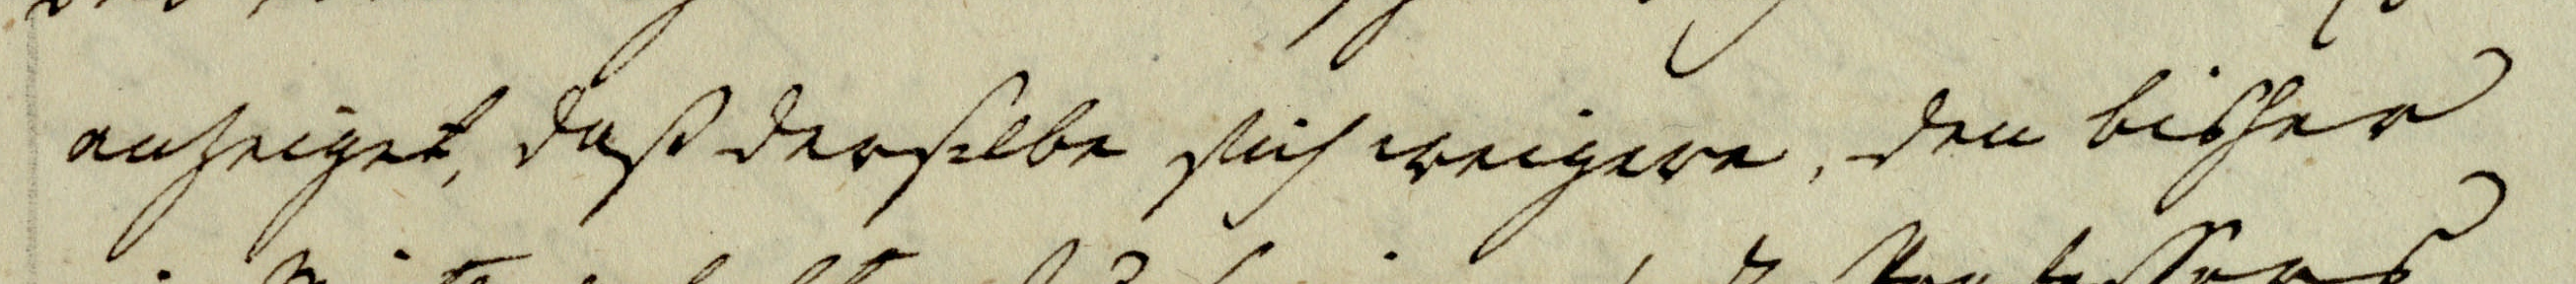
anzeiget, daß derselbe sich weigere, den bisher
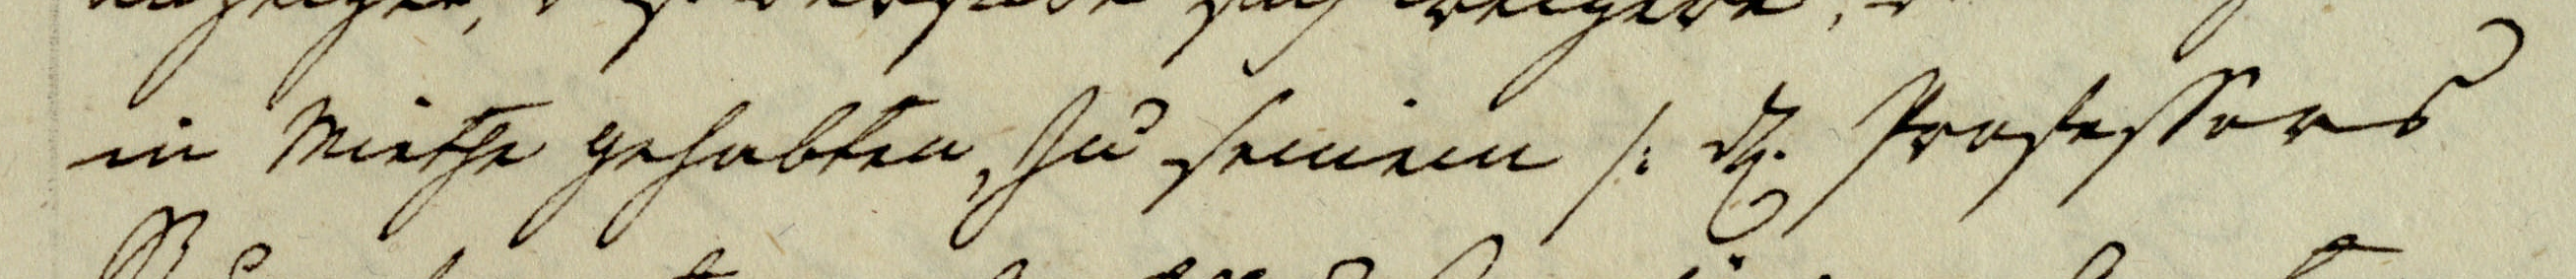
in Miethe gehabten, zu seinem /: dh. Professors
